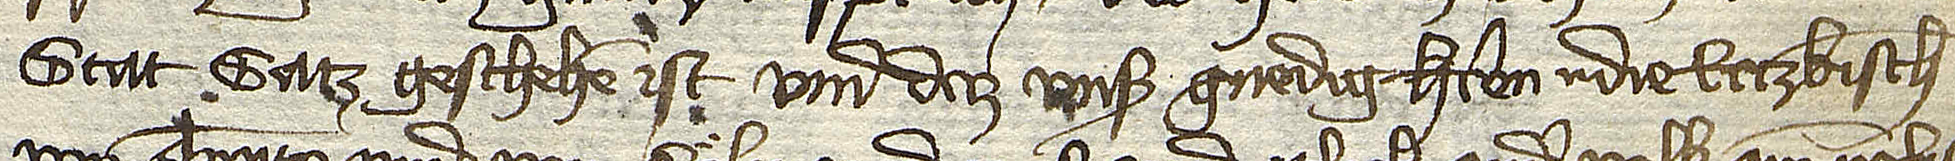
Stat Sacʒ geſchehe* iſt vnd daʒ vnſ* gnedig h*ren ~die Ercʒbiſch*
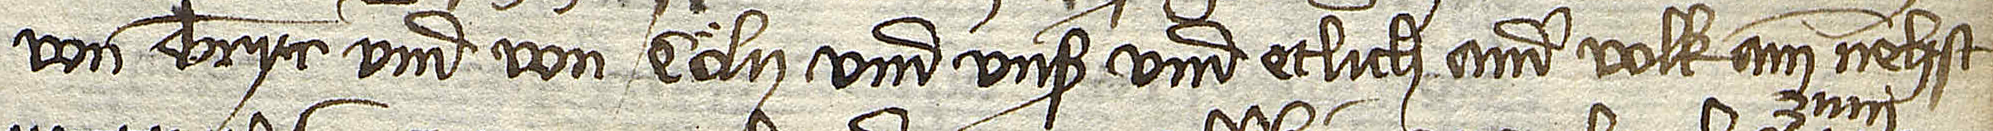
von Tryr vnd von Cöln vnd vnſ* vnd etlich and* volk am* nehſt
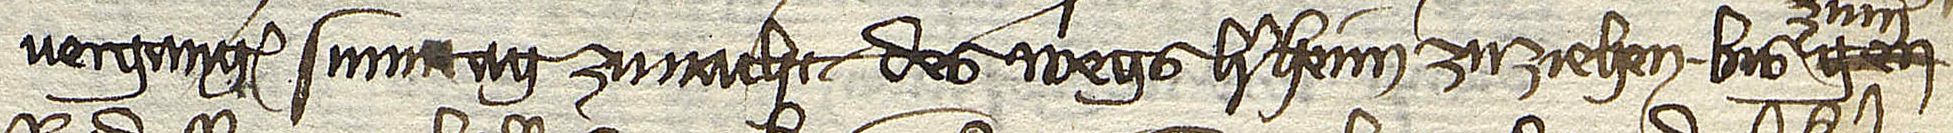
uergang* ſunntag ʒunacht / des wegs h*heim ʒu ʒiehen . bis gen
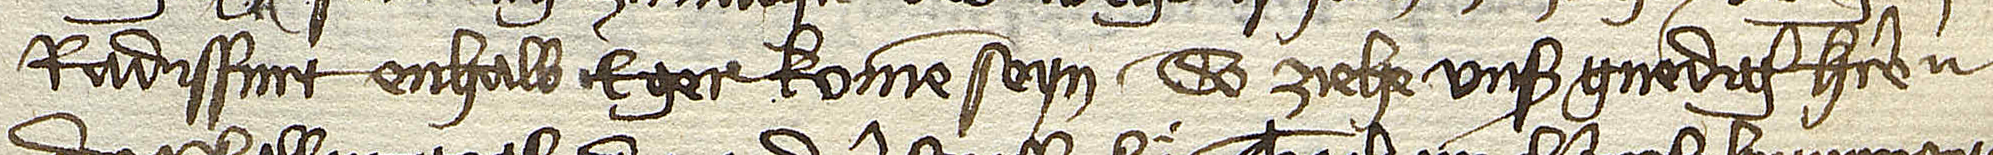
Radiſfurt enhalb Eger kome* ſeyn / So ʒiehe vnſ* gnedig* h*re ~
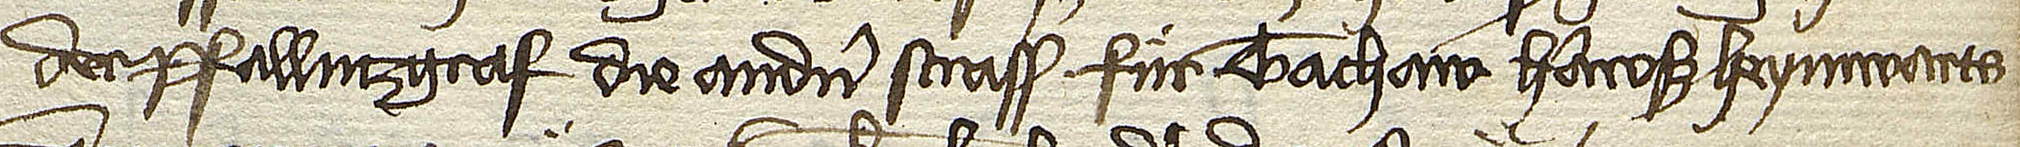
der Pfallncʒgraf die and*n ſtraſſ für Tachaw h*awſʒ heymwarts
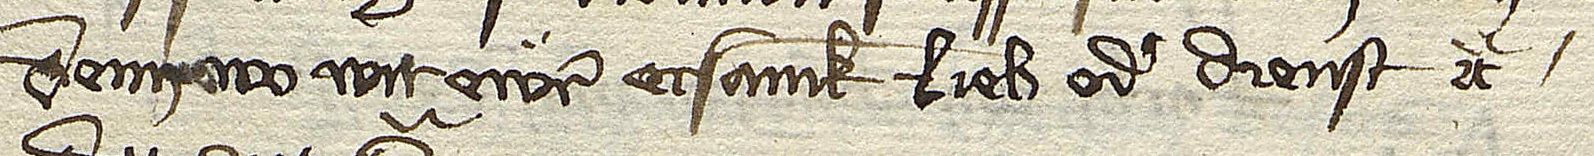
Denn wo wir ew*r erſamk* lieb od* dienſt ec* /
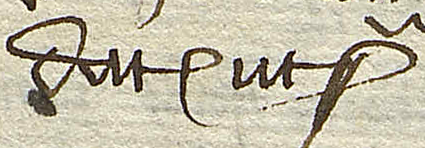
Dat* ut ſ*
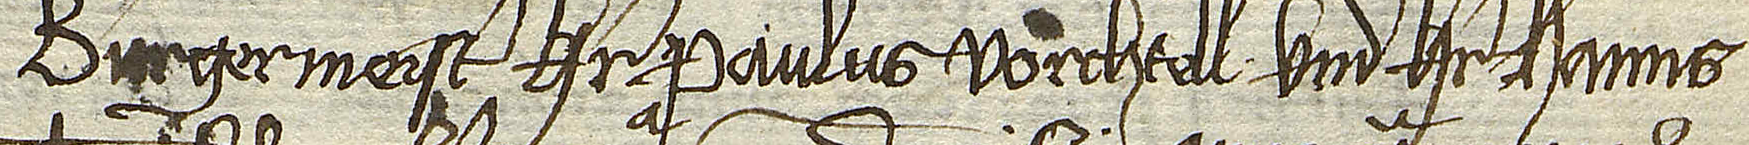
Burgermeiſt* H*r Paulus Vorchtell Vnd H*r Hanns
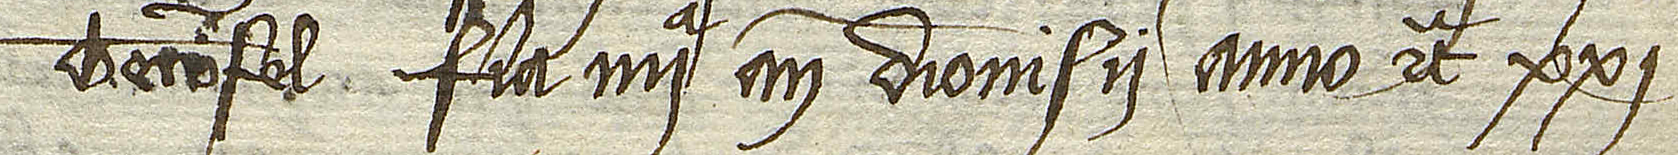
Tewfel fia* iiii* an* dioniſii anno ec* xxi*
